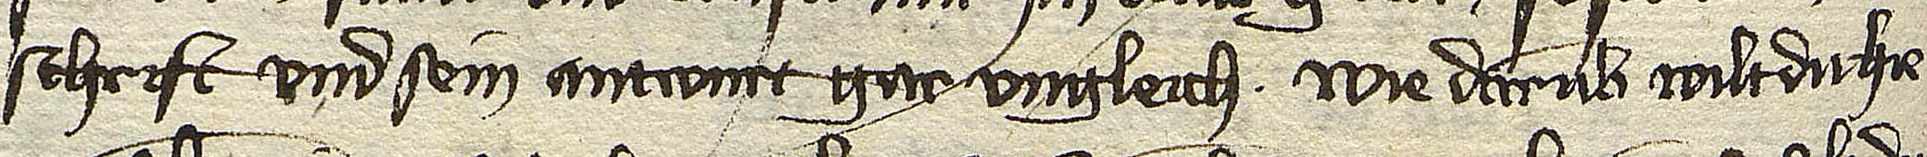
ſchrift vnd ſein antwurt gar vngleich . Wie darub* wilt du hie
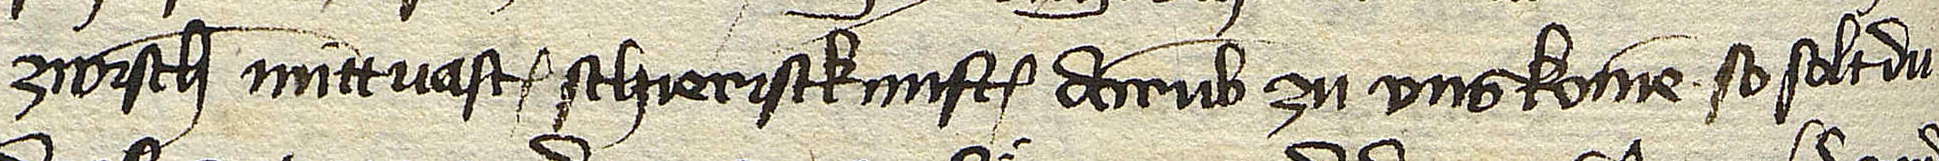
ʒwiſch* mittuaſt* ſchieriſtkunft* darüb* ʒu vns kome* . ſo ſolt du
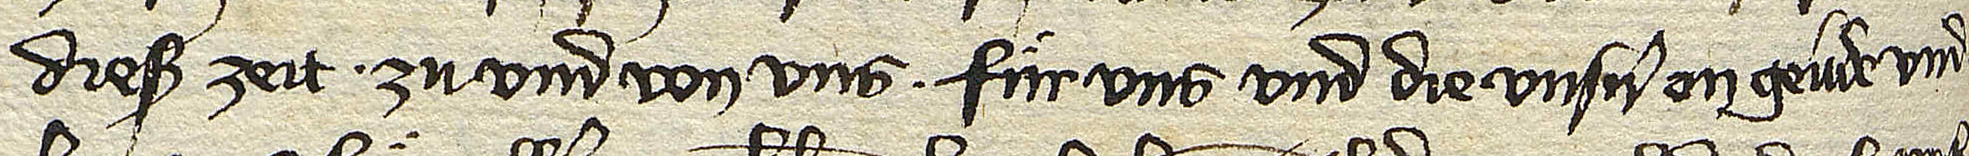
dieſ* ʒeit . ʒu vnd von vns . für vns vnd die vnſ*n on geu*de vnd
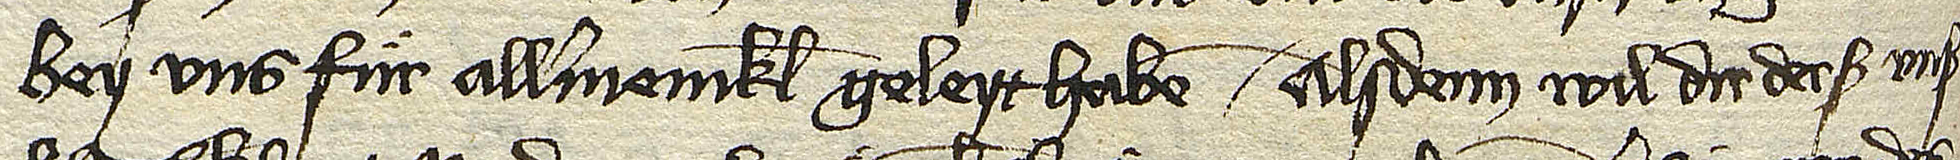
bey vns für all*menikl* geleyt habe* / alſdenn wil die derſ* vnſ*
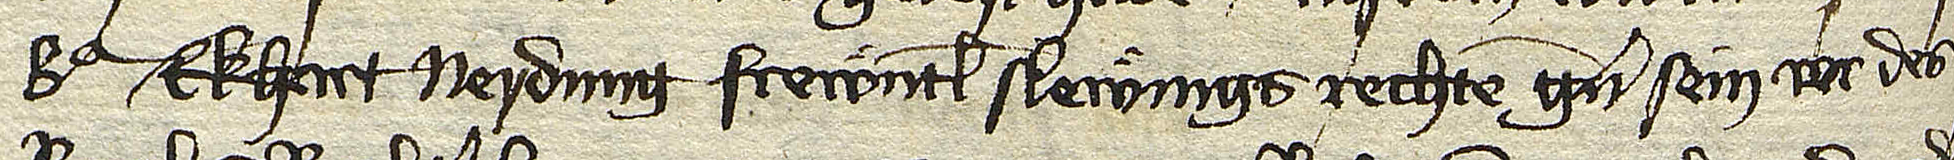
b* / Eckhart Neydung freẅntl* ſleẅnigs rechte* g*n ſein vor des
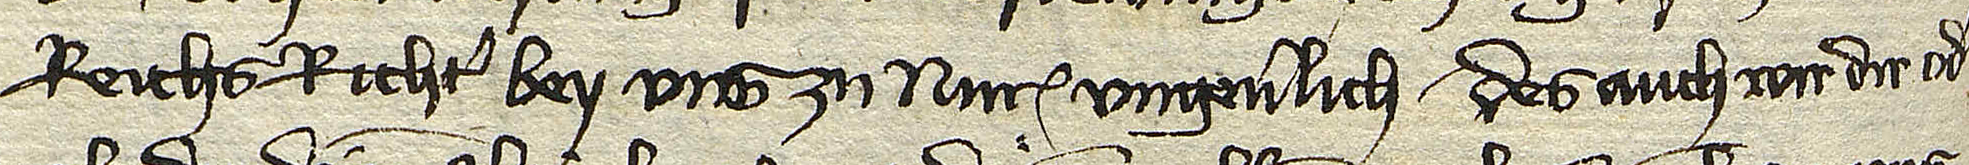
Reichs Richt* bey vns ʒu Nur* vngeu*lich / des auch wir dir od*
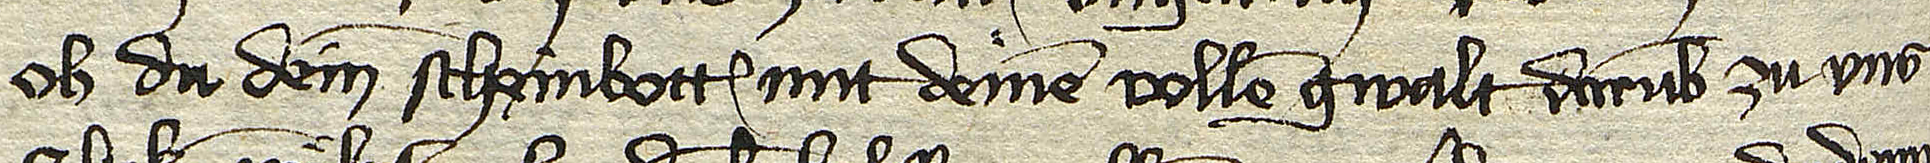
ob du dein* ſcheinbott* mit deine* volle* gwalt darub* ʒu vns
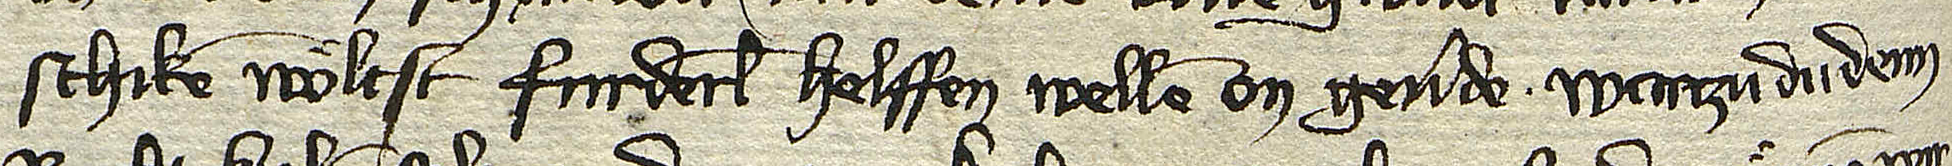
ſchike* wöltſt furderl* helffen welle* on geu*de warcʒu du denn
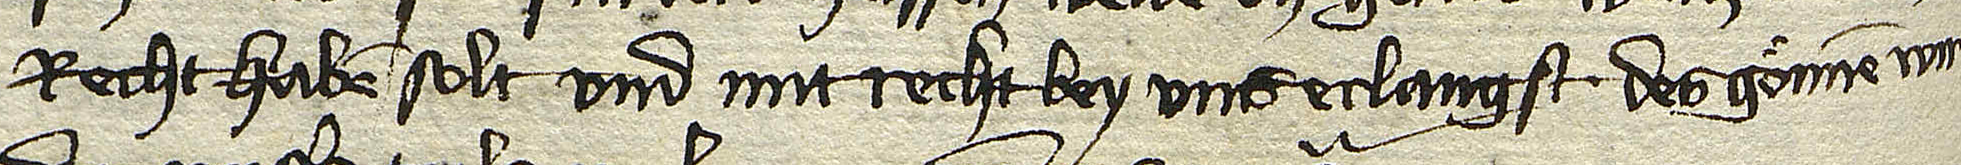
Recht habe* ſolt vnd mit recht bey vns erlangſt . des gönne* wir
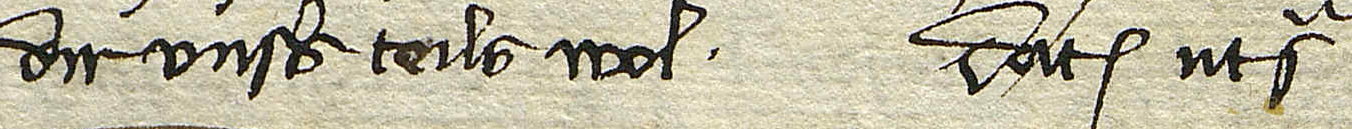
dir vnſ*s teils wol . Dat ut ſ*
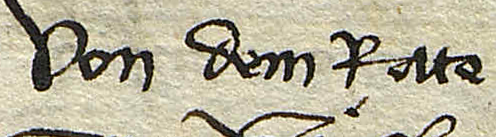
Von dem Rate
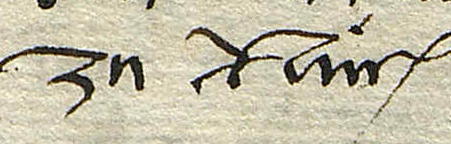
ʒu Nür*
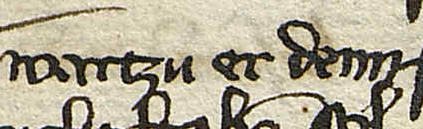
warcʒu er denn
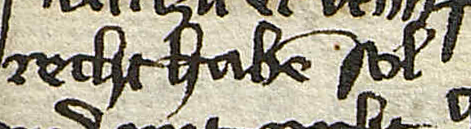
recht habe* ſol
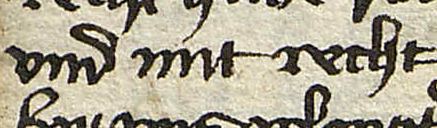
vnd mit recht
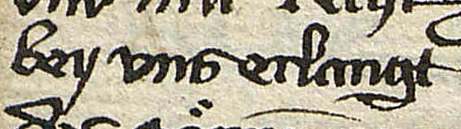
bey vns erlangt
